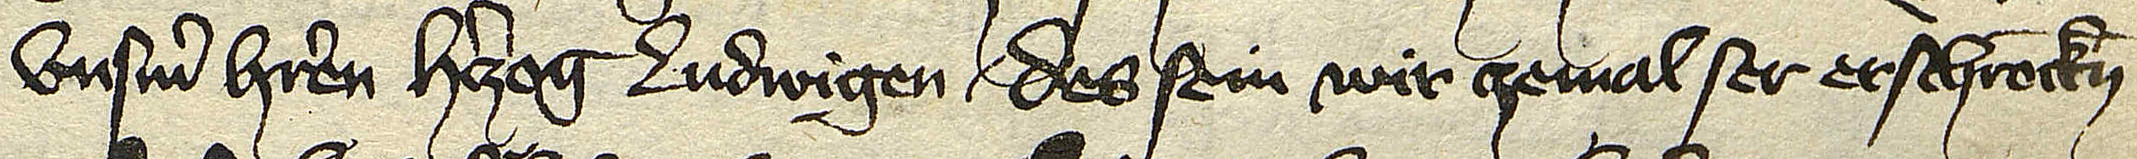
vnſm* hr*en h*cʒog Ludwigen / des ſein wir cʒemal ſer erſchrockn*
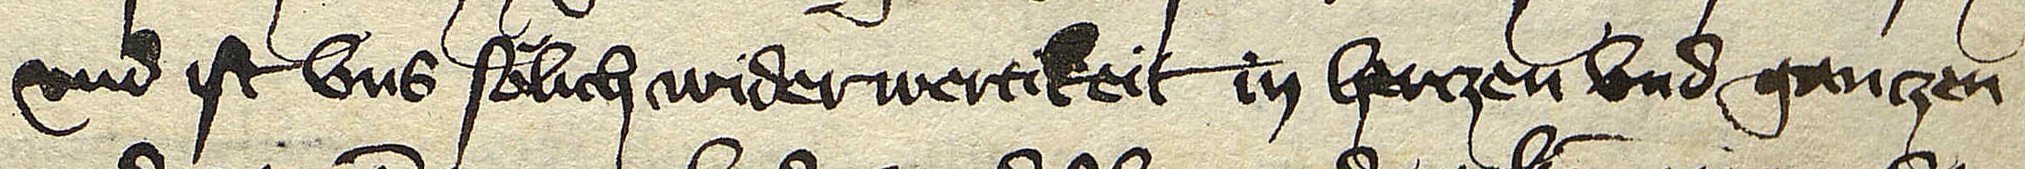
vnd iſt vns ſölich widerwertikeit in hercʒen vnd gancʒen
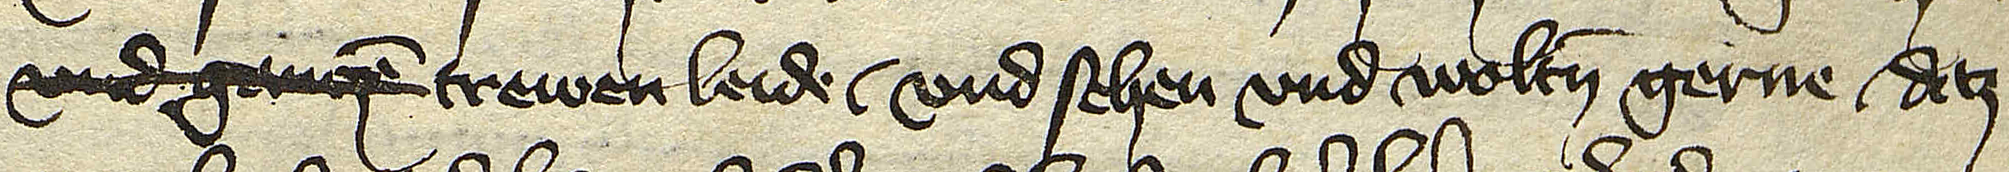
vnd gancʒe* trewen leide / vnd ſehen vnd woltn* gerne / daʒ
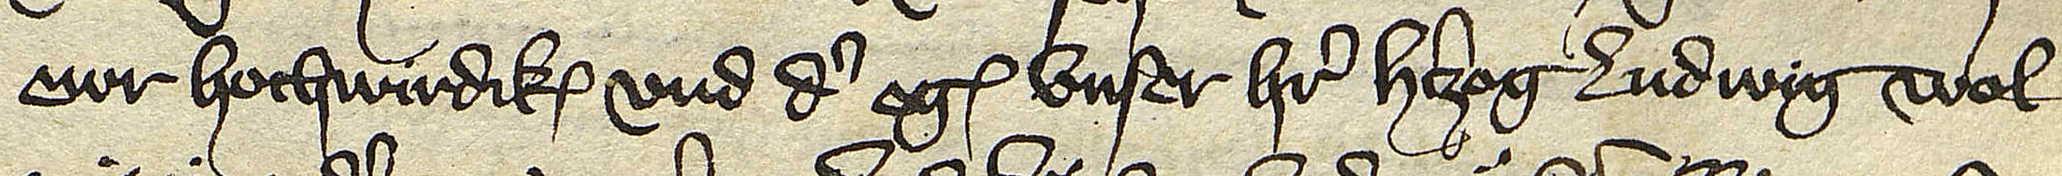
ewr hochwirdik* vnd d* eg* vnſer hr* h*cʒog Ludwig wol
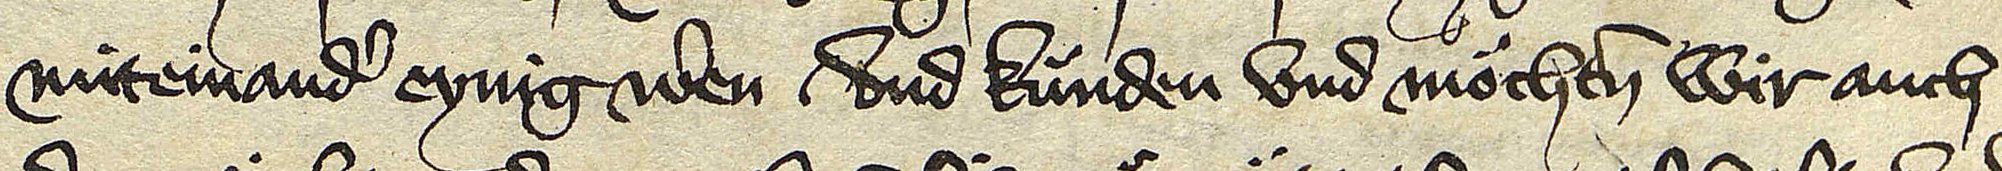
miteinand* eynig w*en / vnd künden vnd möchtn* wir auch
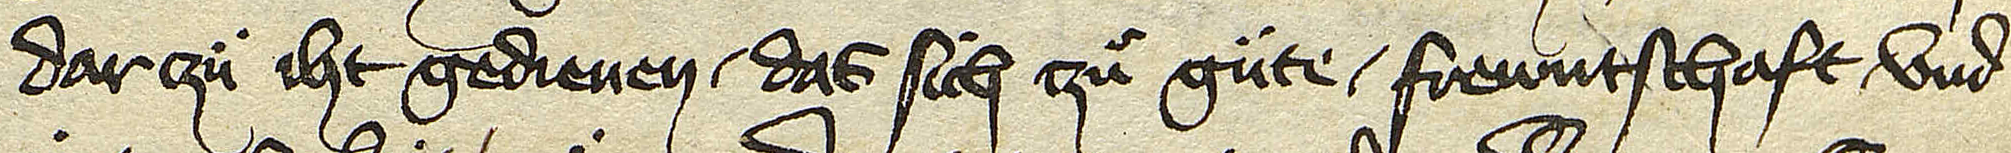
dar cʒü iht gedienen / das ſich cʒu güte / frewntſchaft / vnd
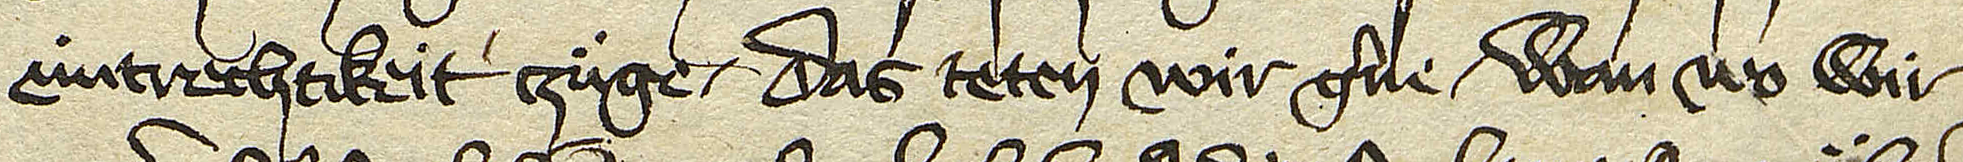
eintrechtikeit cʒüge / Das teten wir g*ne / Wan wo wir
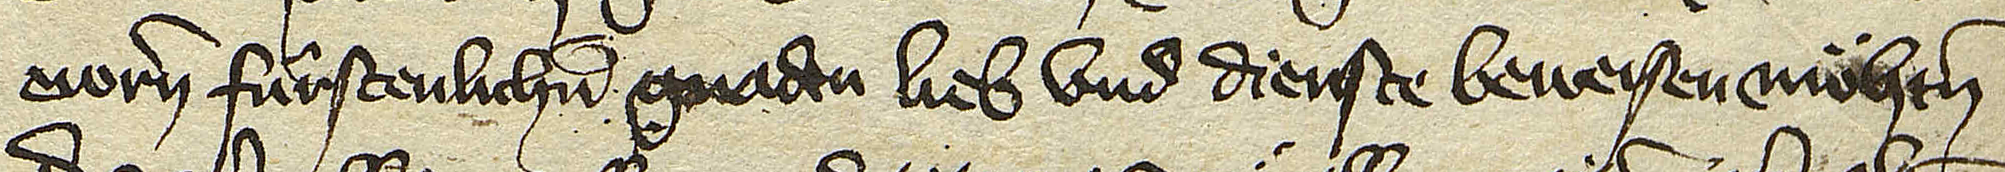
ewr*n fürſtenlichn* gnaden lieb vnd dienſte beweiſen möhtn*
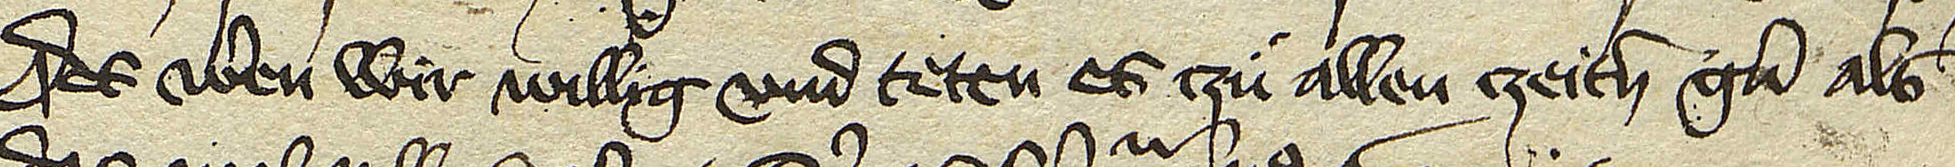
Das w*en wir willig vnd teten es cʒü allen cʒeitn* gn* als
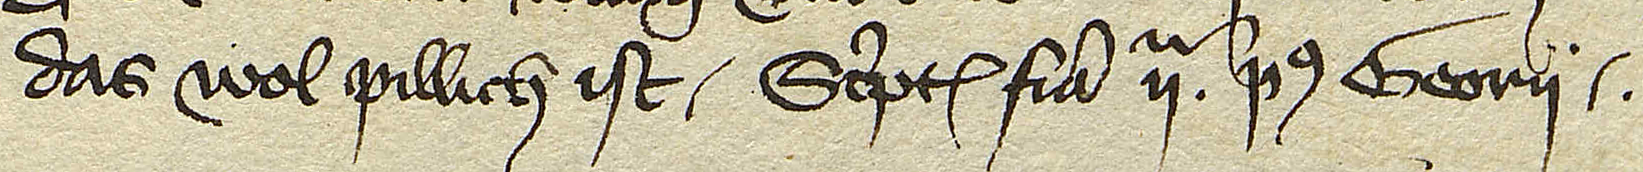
das wol pillich iſt / Scpt* fia* ii* . p* Georii / .
